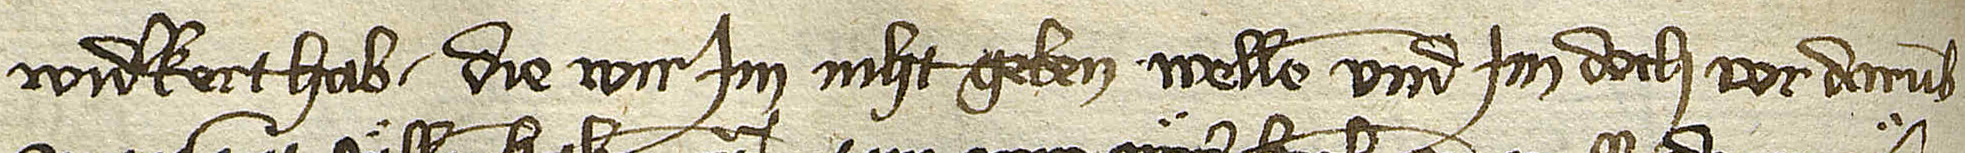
wid*kert hab / die wie Im niht geben welle* vnd Im doch vor darub*
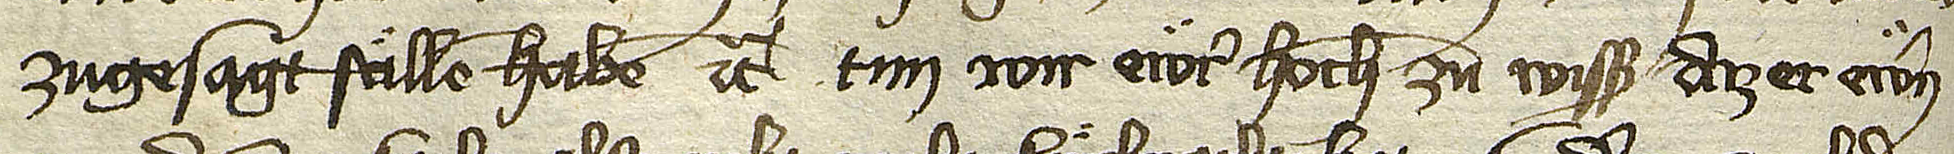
ʒugeſagt ſölle* habe* ec* tun wir eẅr* hoch* ʒu wiſſ* daʒ er eẅ*n
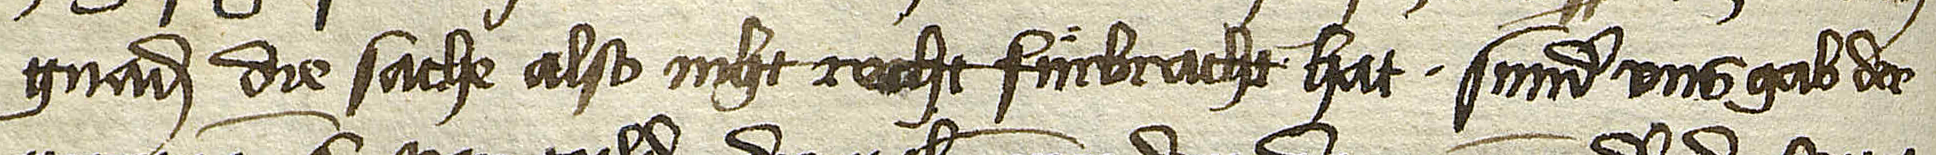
gnad* die ſache alſo niht recht fürbracht hat . ſund* vns gab der
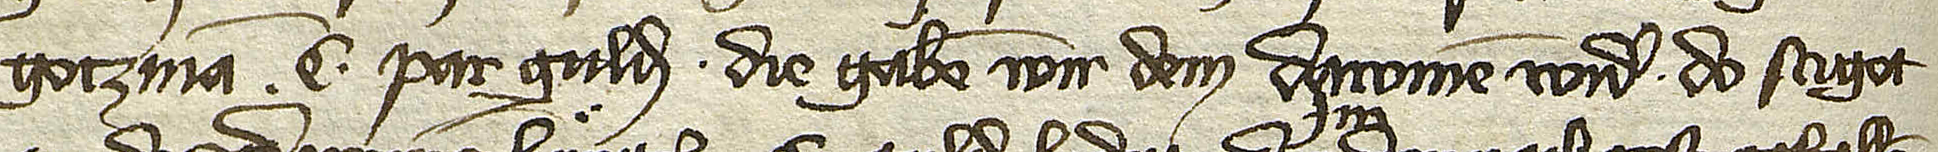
gocʒma* C . par guld* . die gabe* wir dem Dawme* vnd . do ſagot
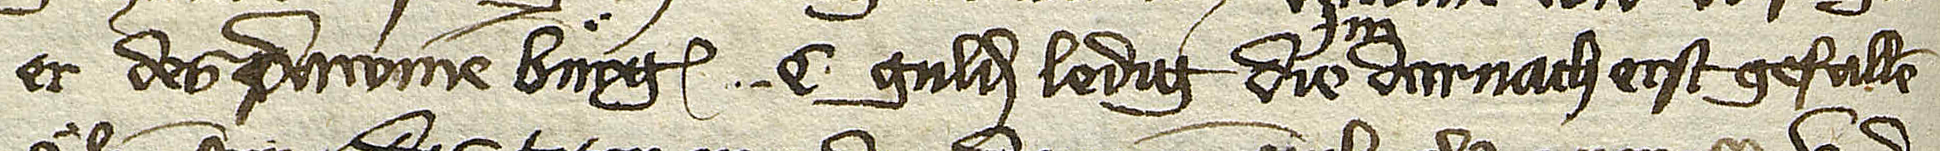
er des Dawme* bürg* . C . guld* ledig die darnach erſt gefalle*
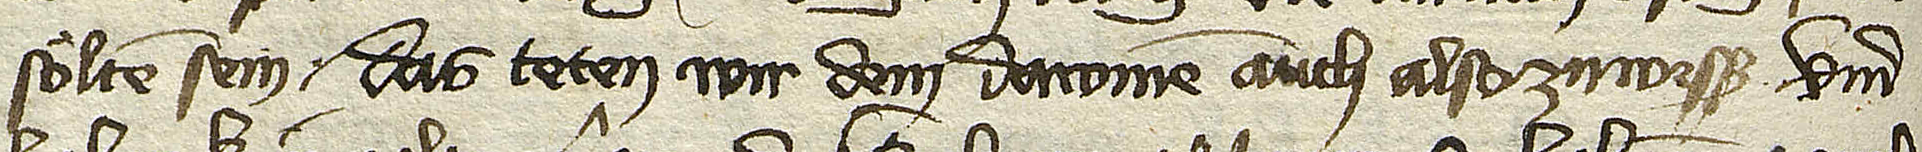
ſölte* ſein / Das teten wir dem Dawme* auch alſo ʒu wiſſ* . Vnd
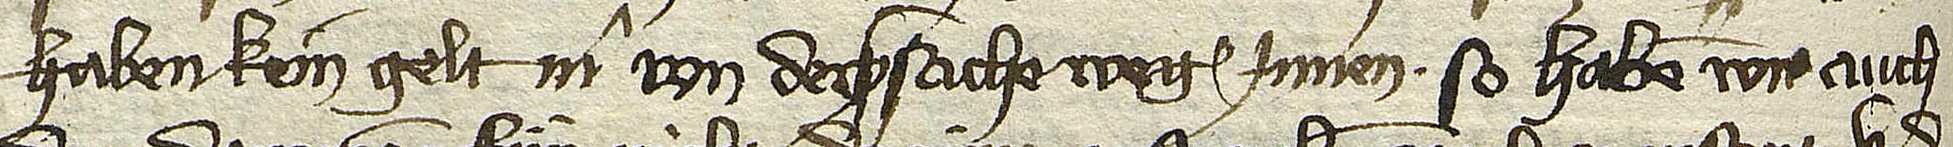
haben kein gelt m* von derſ* ſache weg* Innen . ſo habe* wir auch
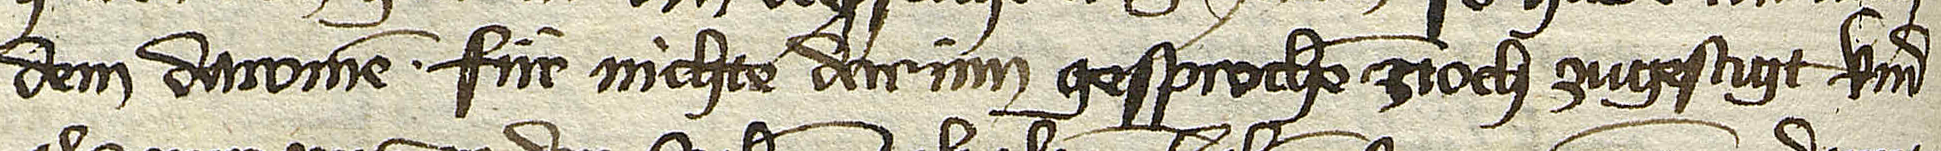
dem dawme* . für nichte darinn geſproche* noch ʒugeſagt Vnd
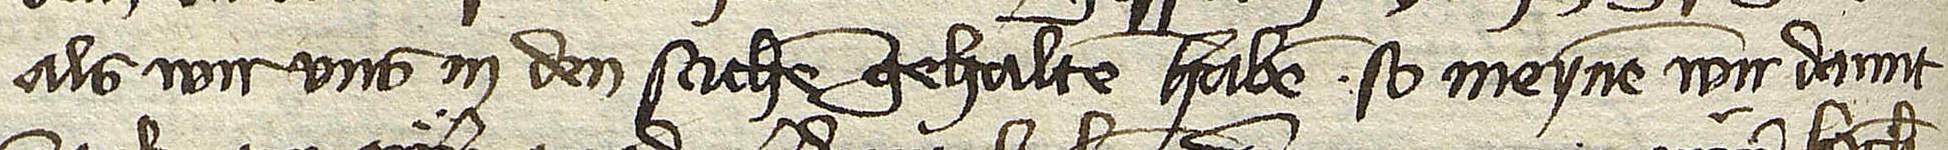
als wir vns in den ſache* gehalte* habe* . ſo meyne* wir damit
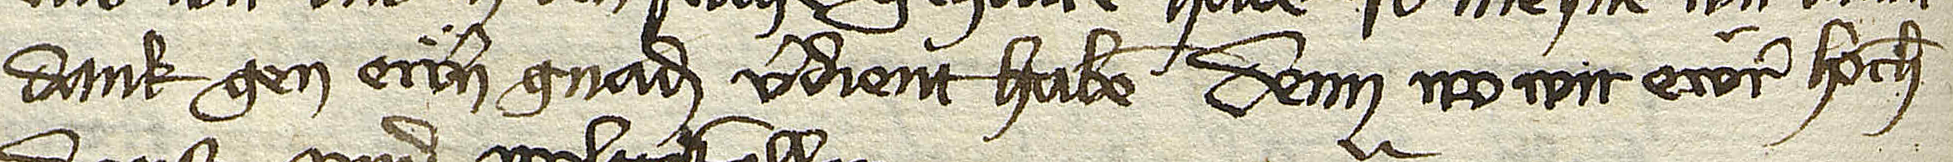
dank gen eẅn* gnad* v*dient habe* Denn wo wir eẅr* hoch*
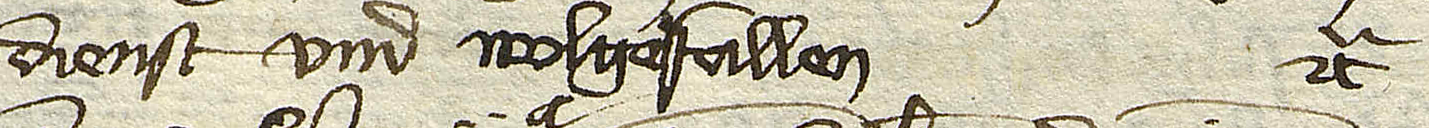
dienſt vnd wolgefallen ec*
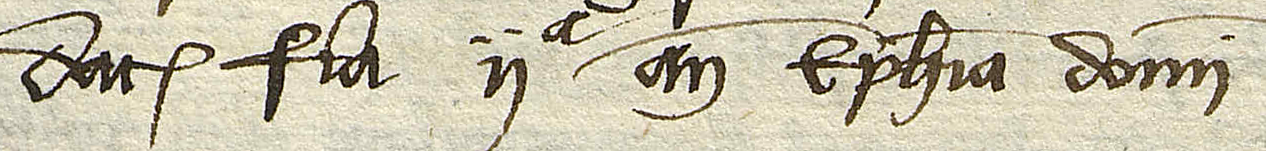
Dat f*ia ii* / an* Ep*hia dom*i
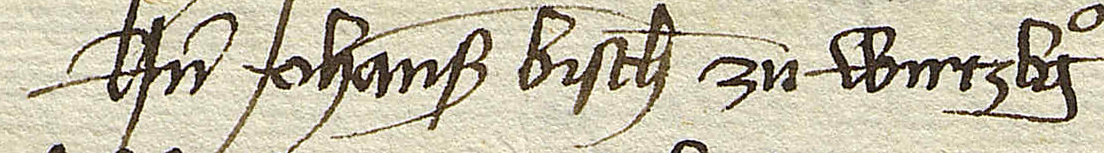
Hn* Iohanſ* biſch* ʒu Wircʒb*g
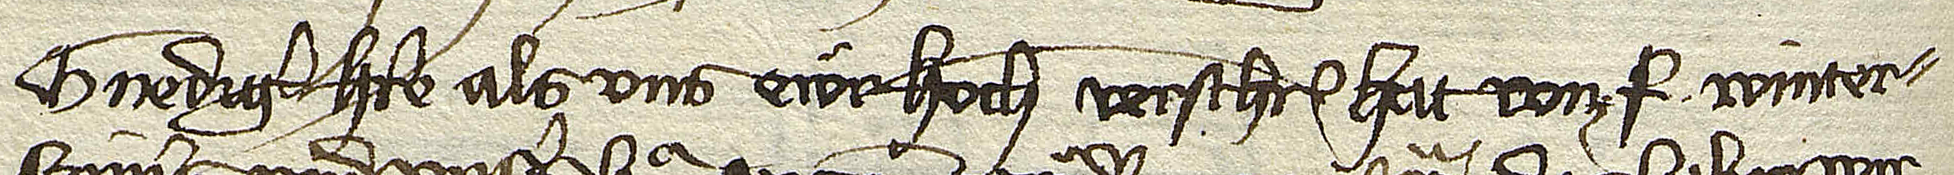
Gnedig* h*re als vns eẅr hoch* verſchr* hat von f* winter =
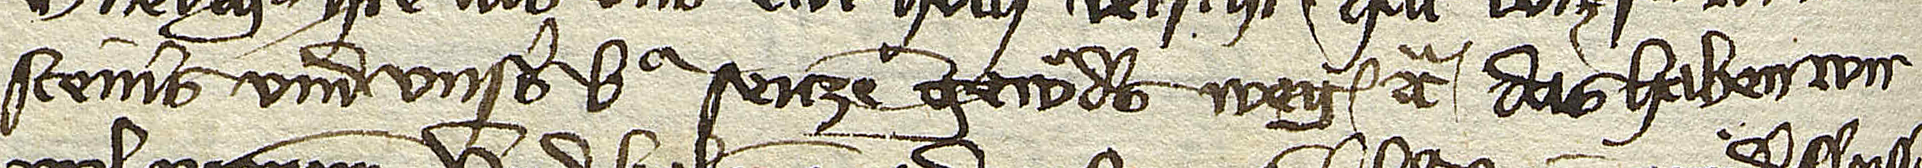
ſteins* vnd vnſ* b* ſeicʒe* geẅd*s weg* ec* das haben wir
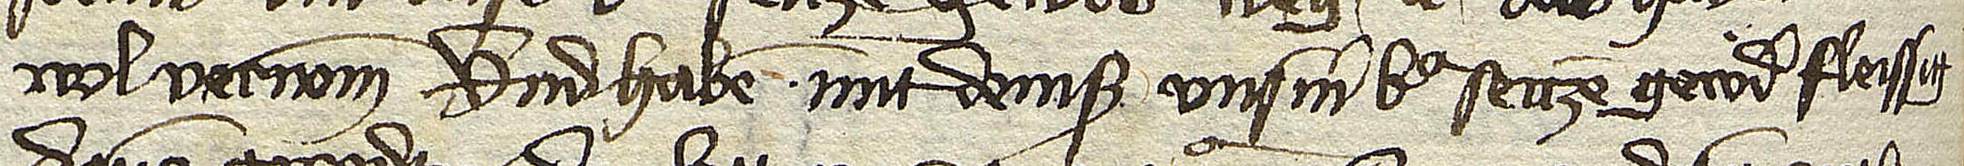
wol vernom* Vnd habe* mit demſ* vnſ*m b* ſeicʒe* gewd* fleiſſig
